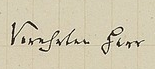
Verehrter Herr
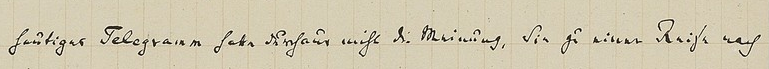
heutiges Telegramm hatte durchaus nicht d. Meinung, Sie zu einer Reise nach
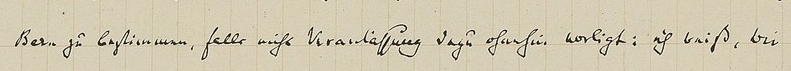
Bern zu bestimmen, falls nicht Veranlassung dazu ohnehin vorliegt: ich weiß, wie
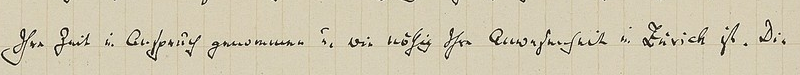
Ihre Zeit in Anspruch genommen u. wie nöthig Ihre Anwesenheit in Zürich ist. Die
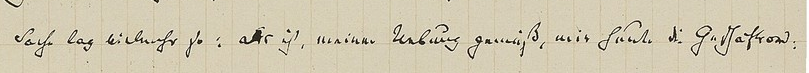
Sache lag vielmehr so: als ich, meiner Uebung gemäß, mir heute die Geschäftsord-
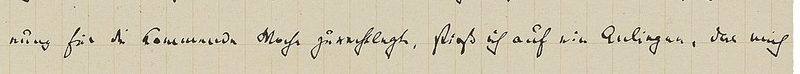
nung für die kommende Woche zurechtlegte, stieß ich auf ein Anliegen, das mich
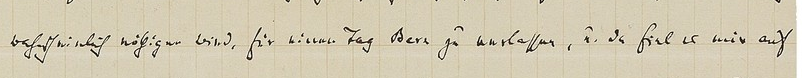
wahrscheinlich nöthigen wird, für einen Tag Bern zu verlassen, u. da fiel es mir auf
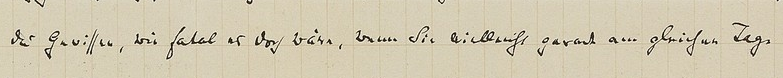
das Gewissen, wie fatal es doch wäre, wenn Sie vielleicht gerade am gleichen Tage
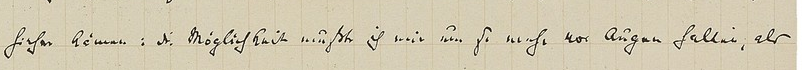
hieher kämen: die Möglichkeit mußte ich mir um so mehr vor Augen halten, als
